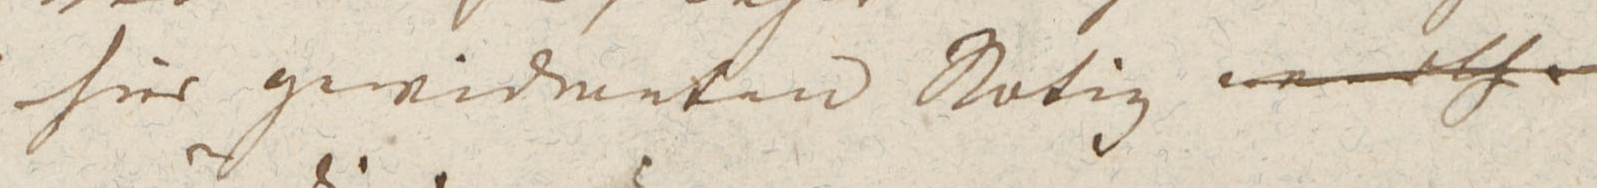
hier gewidmeten Notiz werth.
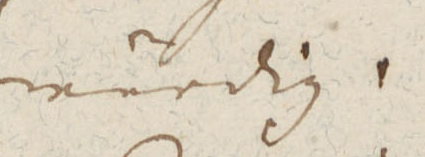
würdig.
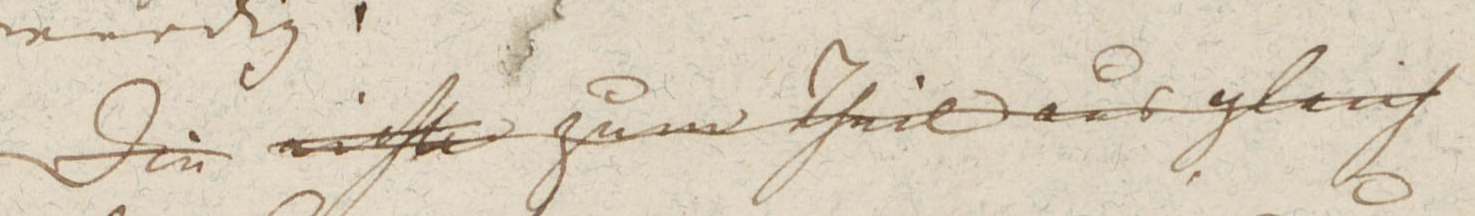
Die nicht zum Theil aus gleich
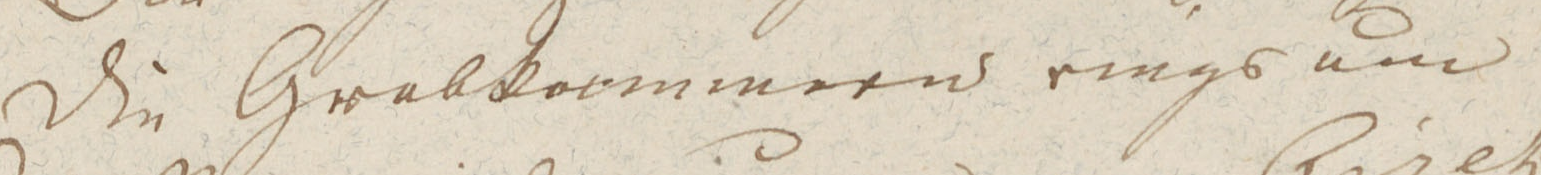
Die Grabkammern rings um
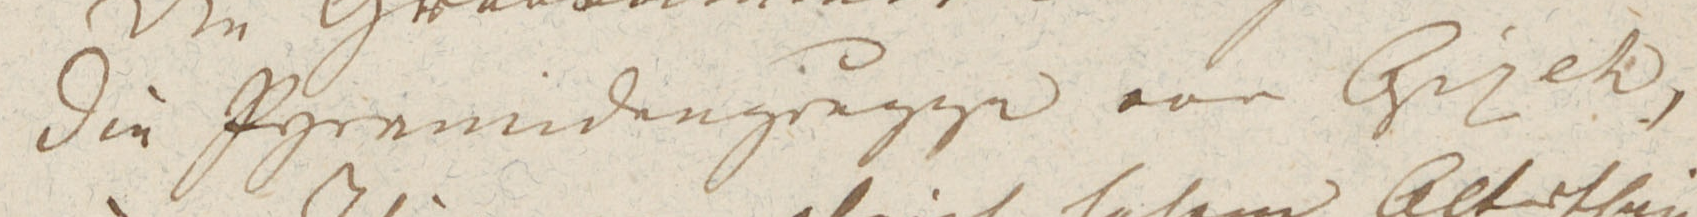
die Pyramidengruppe vor Gizeh,
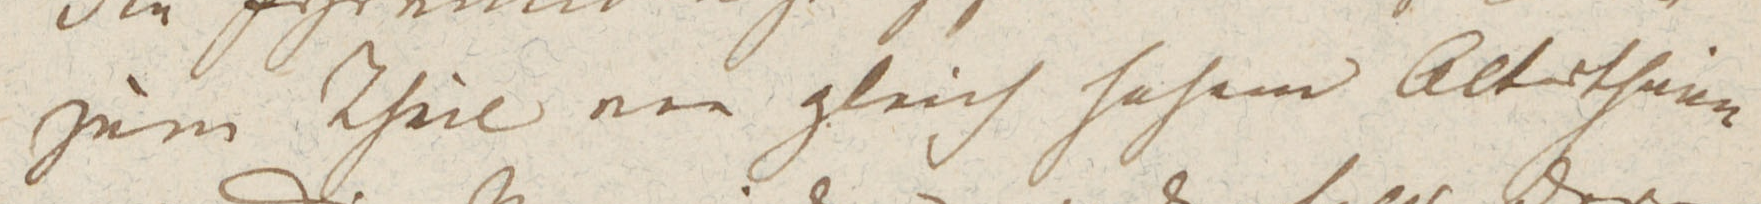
zum Theil von gleich hohem Alterthume
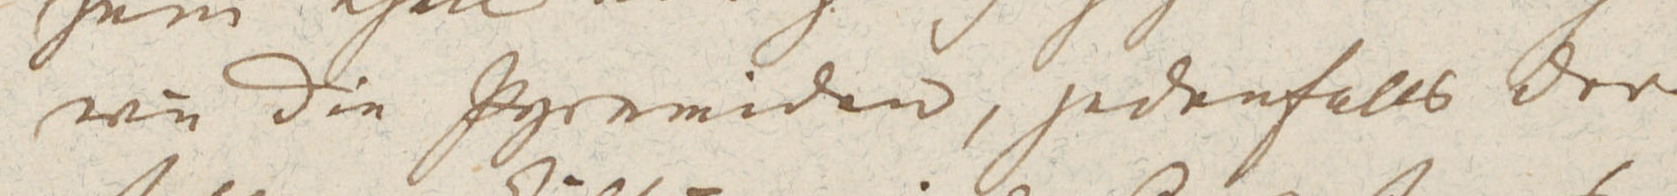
wie die Pyramiden, jedenfalls der-
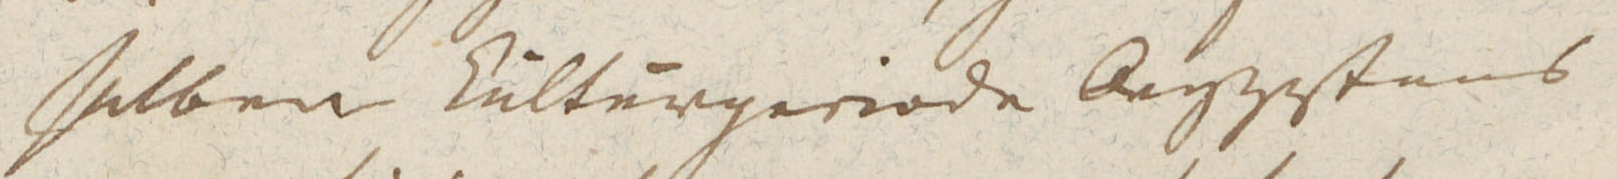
selben Culturperiode Aegyptens
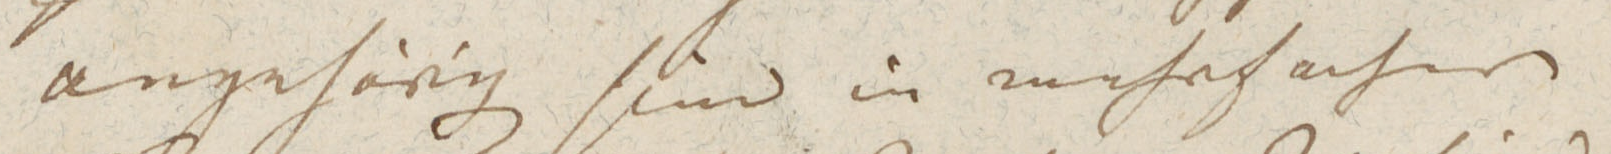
angehörig sind in mehrfacher
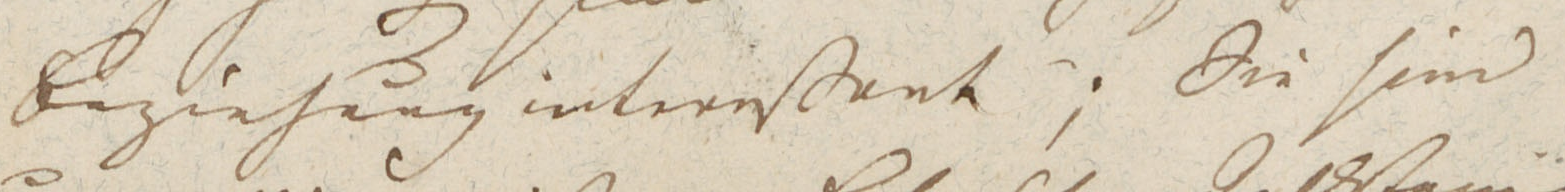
Beziehung interessant; Sie sind
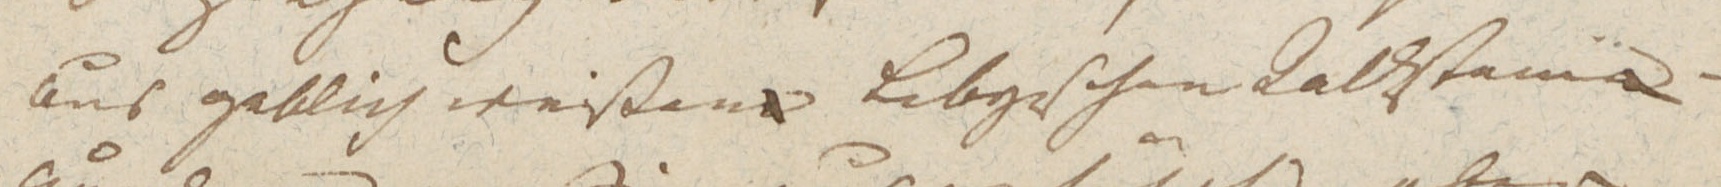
aus geblich weissemn Libyschen Kalksteine-
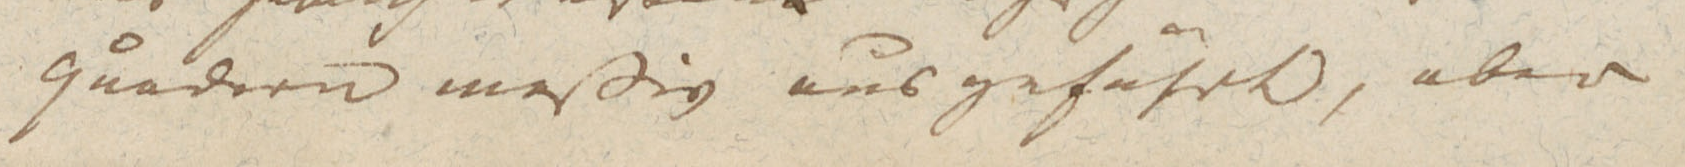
quadern massiv ausgeführt, aber
